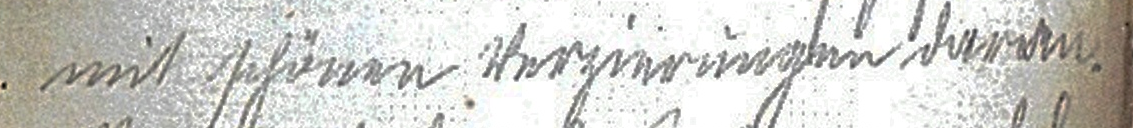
mit schönen Verzierungen daran.
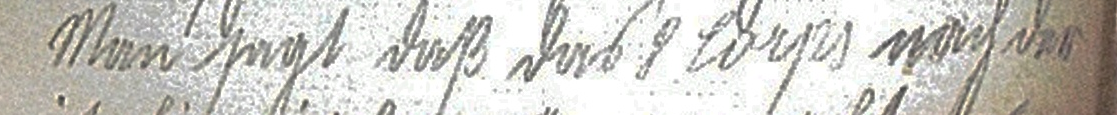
Man sagt daß das 8. Corps nach der
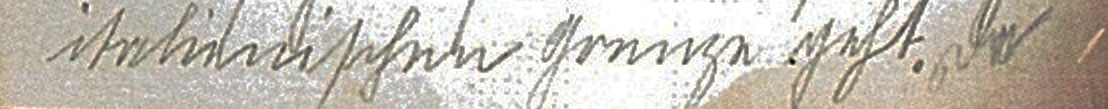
italienischen Grenze geht. Da
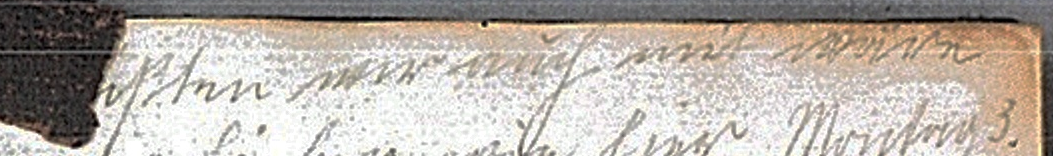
müßten wir auch mit wäre
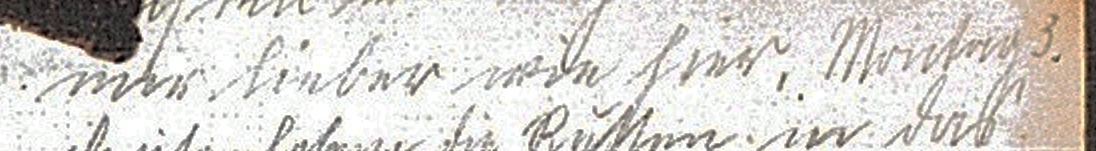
mir lieber wir hier. Montag 3.
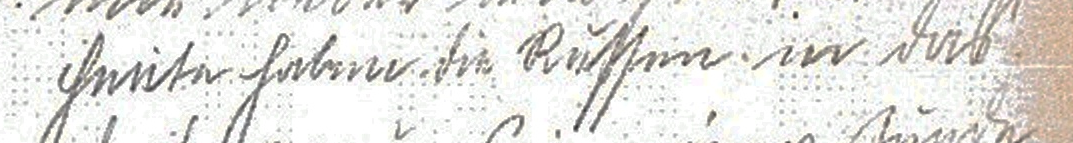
Heute haben die Russen in das
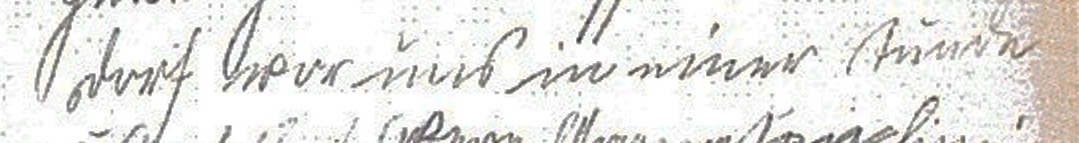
Dorf vor uns in einer Stunde
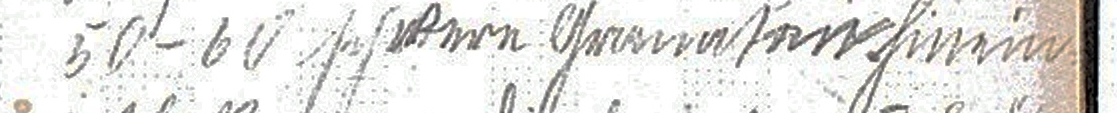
50-60 Rohre Granaten hinein
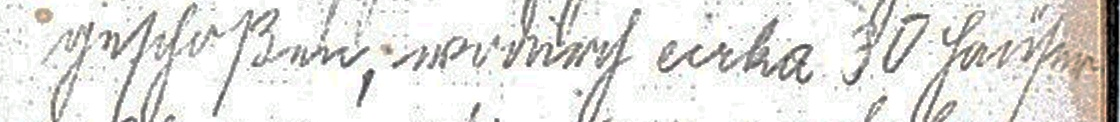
geschoßen, wodurch cirka 30 Häuser
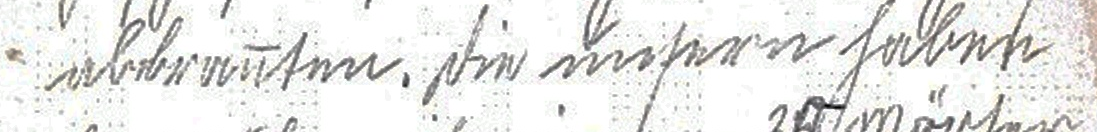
abbrannten. Die unseren haben
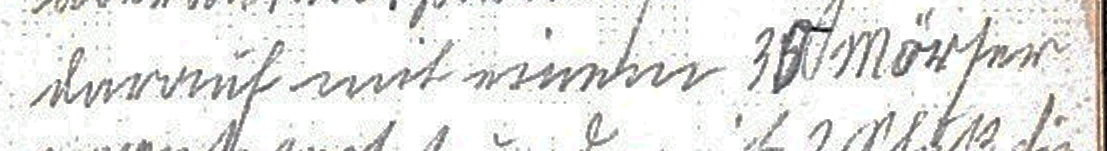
darauf mit einem 35 Mörser
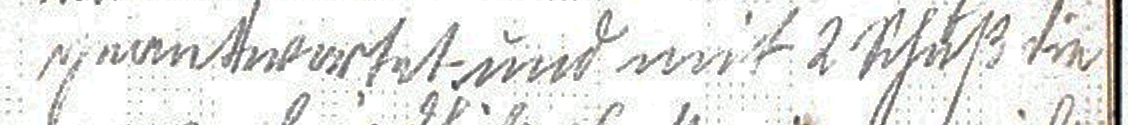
geantwortet und mit 2 Schuß die
